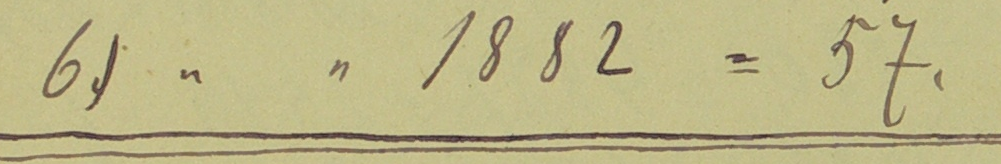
6) * 1882 = 57
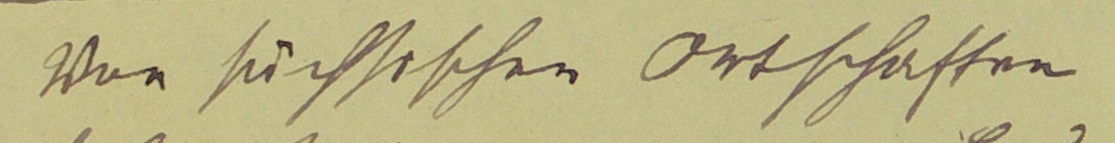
Von sächsichen Ortschaften
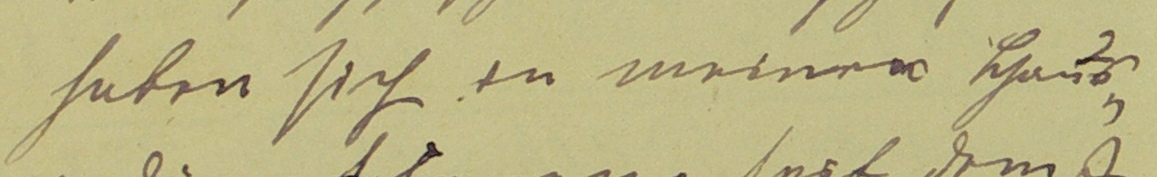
haben sich in meiner Haus¬
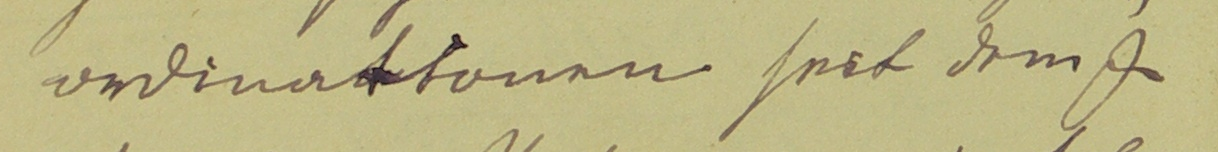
ordination seit dem Jahre
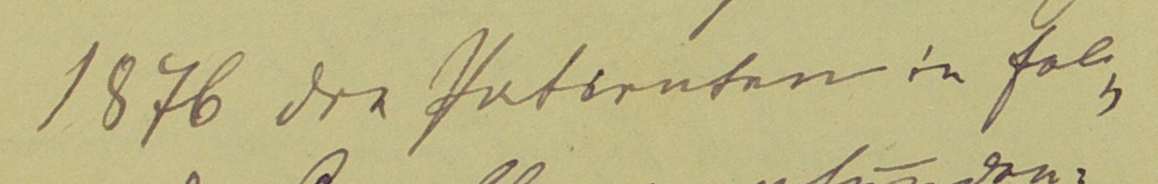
1876 die Patienten in fol¬
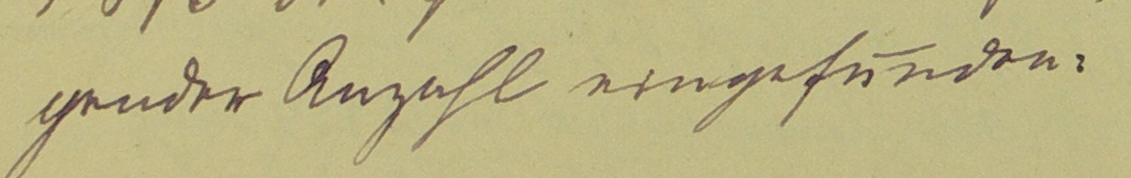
gender Anzahl eingefunden:
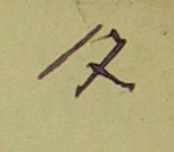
17
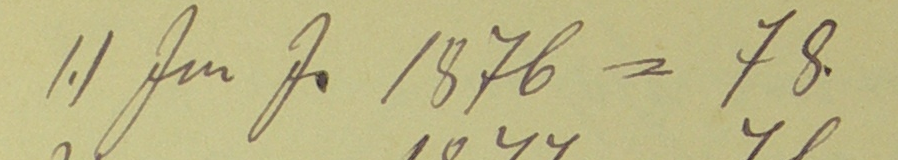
1) Im Jahre 1876 = 78
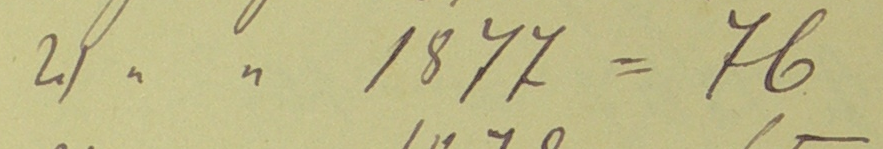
2) * 1877 = 76
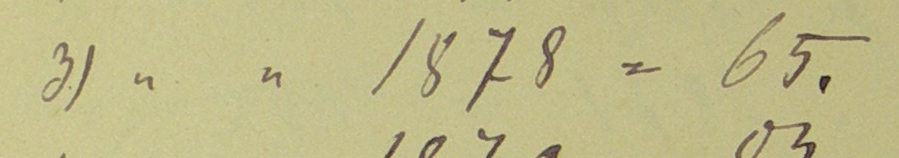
3) * 1878 = 65
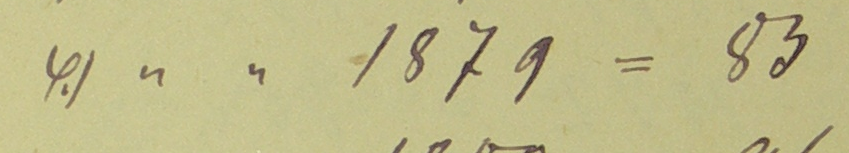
4) * 1879 = 83
